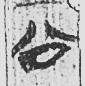公
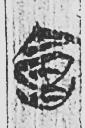會
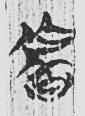者
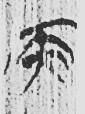侯
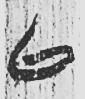㠯（以）
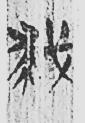{求戈}（救）
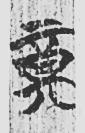奠
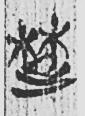楚
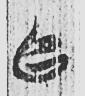𠂤
